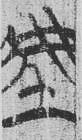○（吾）
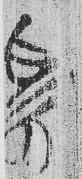○（奚）
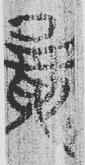異
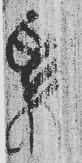○（奚）
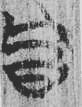同
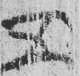五
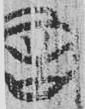音
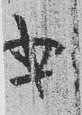才
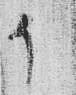人
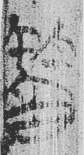○（孰）
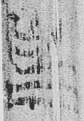爲
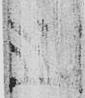之
